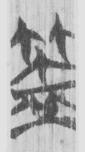蠱
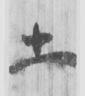土
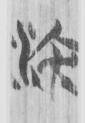沃
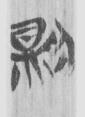則
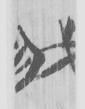我
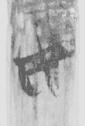母
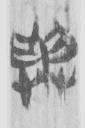與
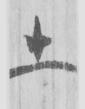土
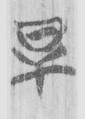旱
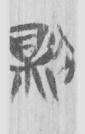則
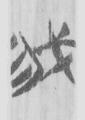我
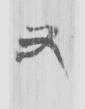又
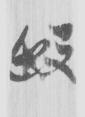臤
